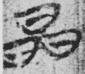晶
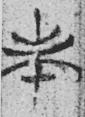未
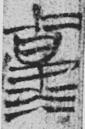淒（濟）
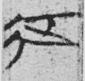征
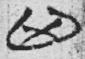凶
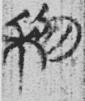利
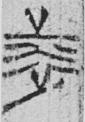涉
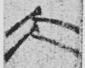大
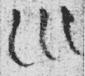川
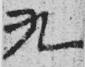九
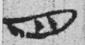四
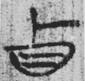貞
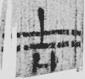吉
